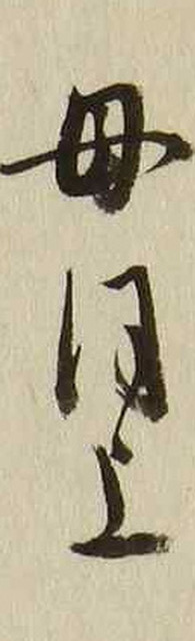母同上
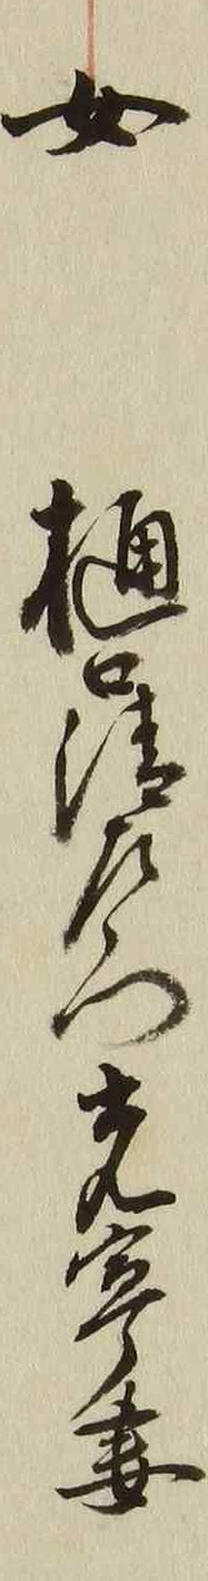女樋口清左衛門光亭妻
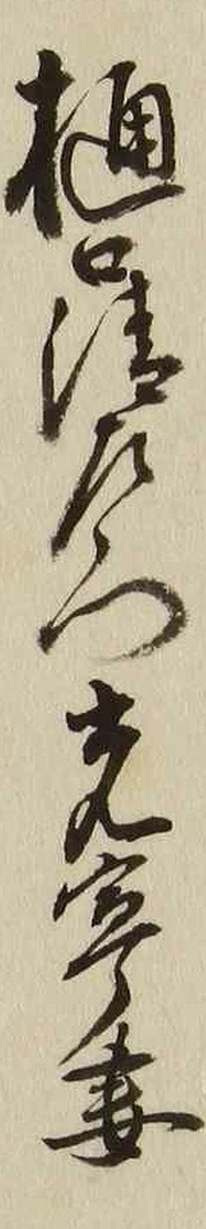女樋口清左衛門光亭妻
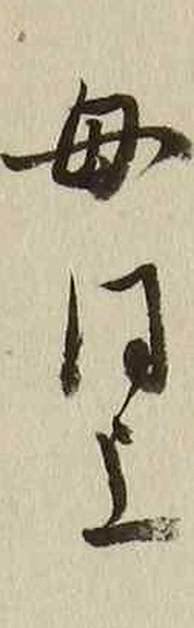母同上
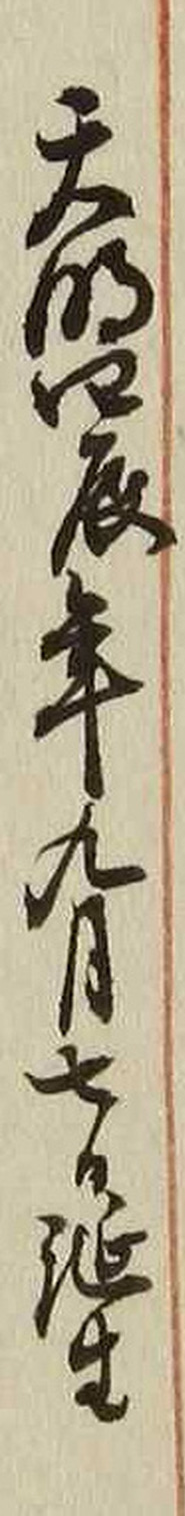天明四辰年九月七日誕生
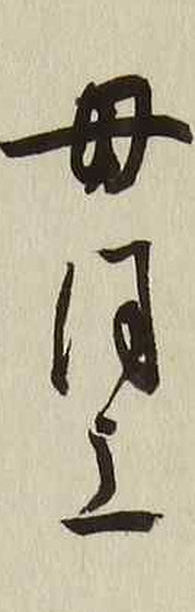母同上
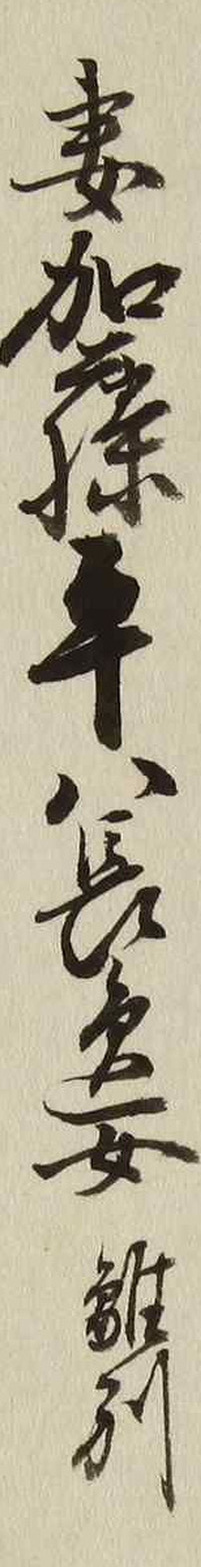妻加藤平八長円女離別
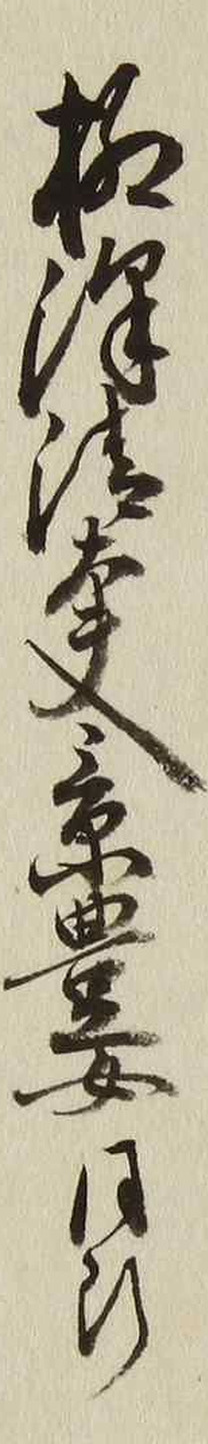柳沢清大夫景豊女同断
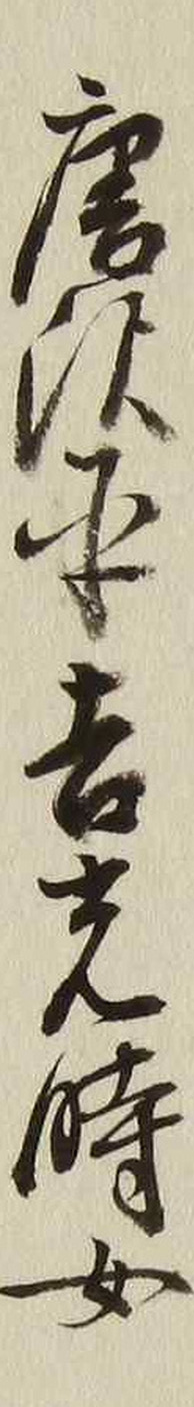唐沢平吉光時女
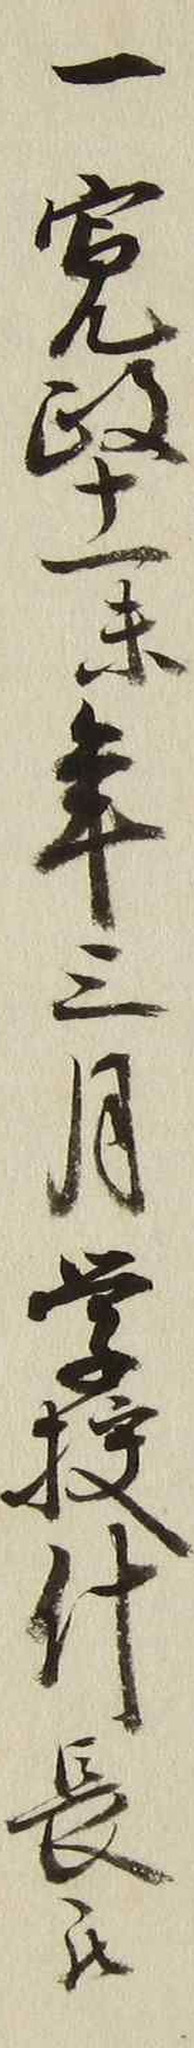一寛政十一未年三月学校什長被
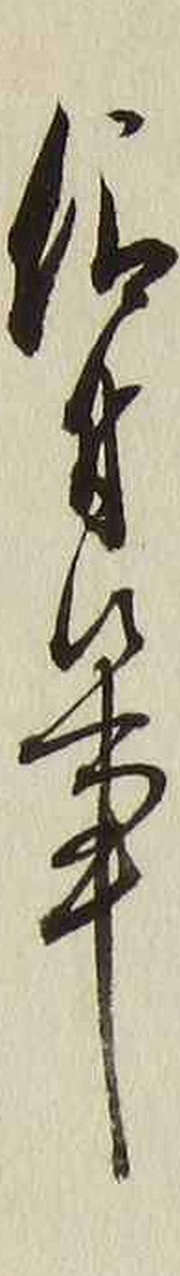仰付候事
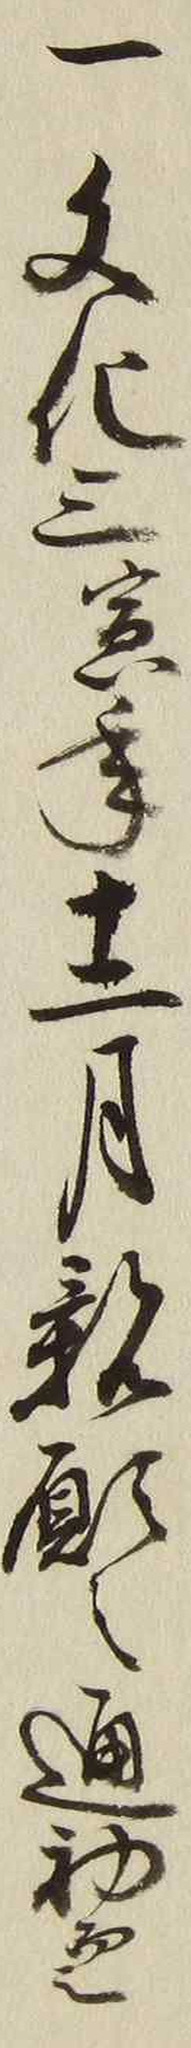一文化三寅年十二月親願之通初而之
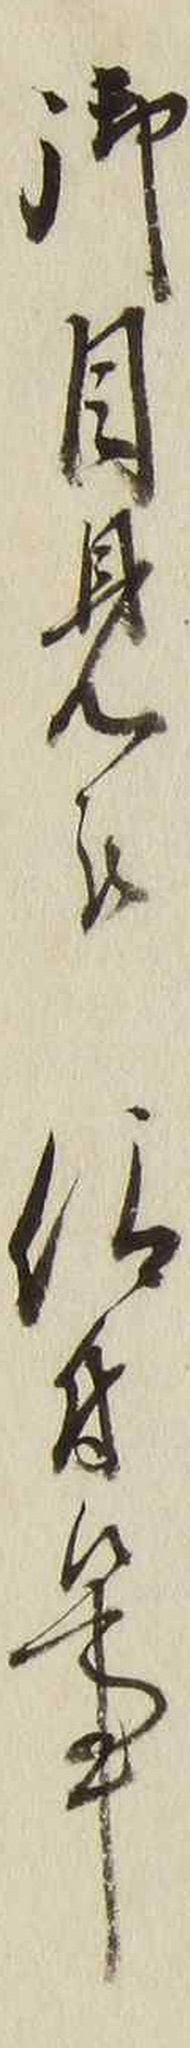御目見被仰付候事

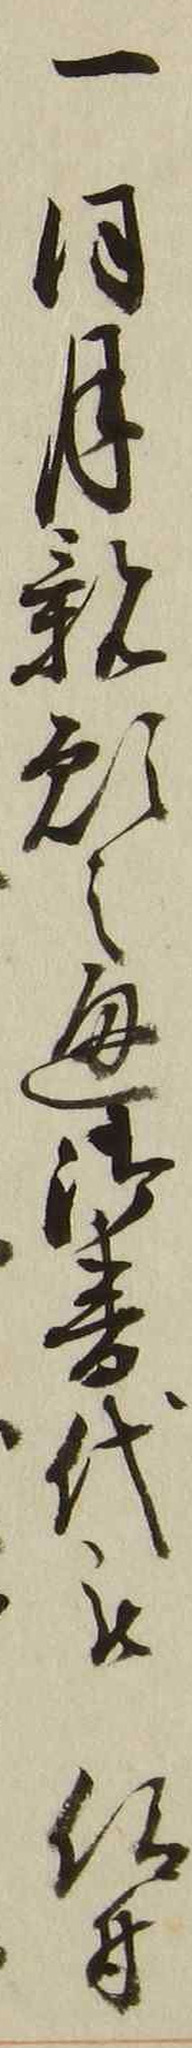一同月親願之通御番代被仰付
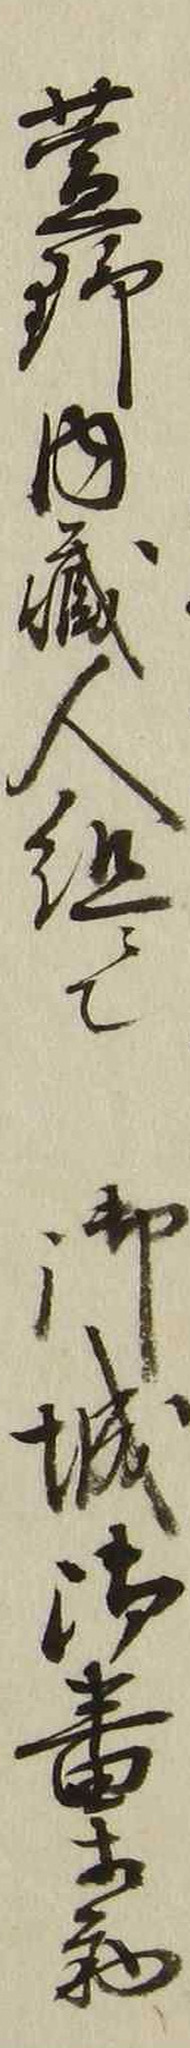萱野内蔵人組ニて御城御番相勤
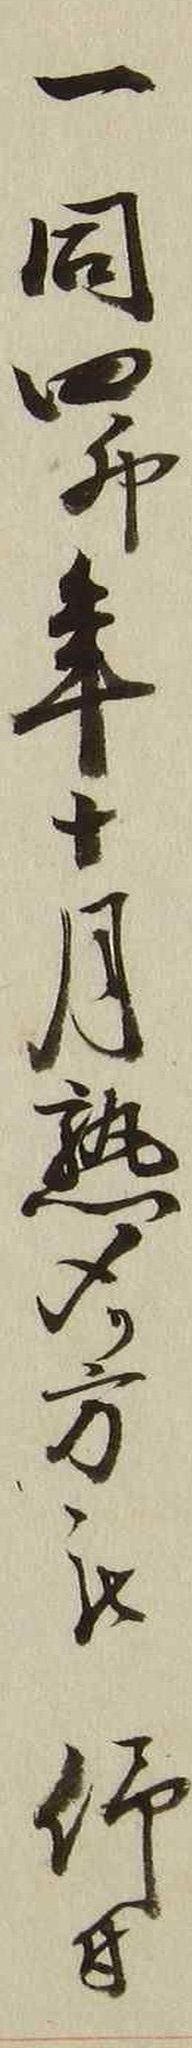一同四卯年十月熟〆り方被仰付
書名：諸士系譜　巻之27　い之部27
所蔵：会津若松市立会津図書館
